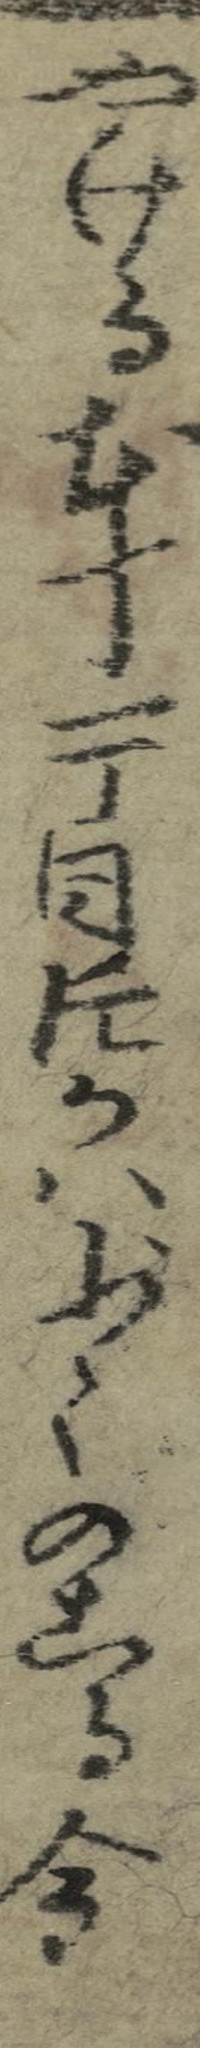やける本丁一丁目片かハ少々のこる金
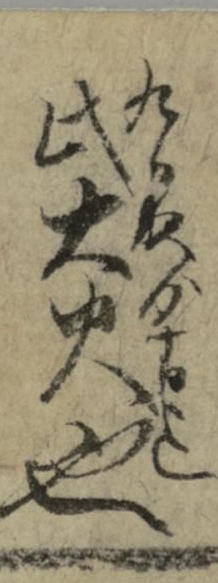此大火也
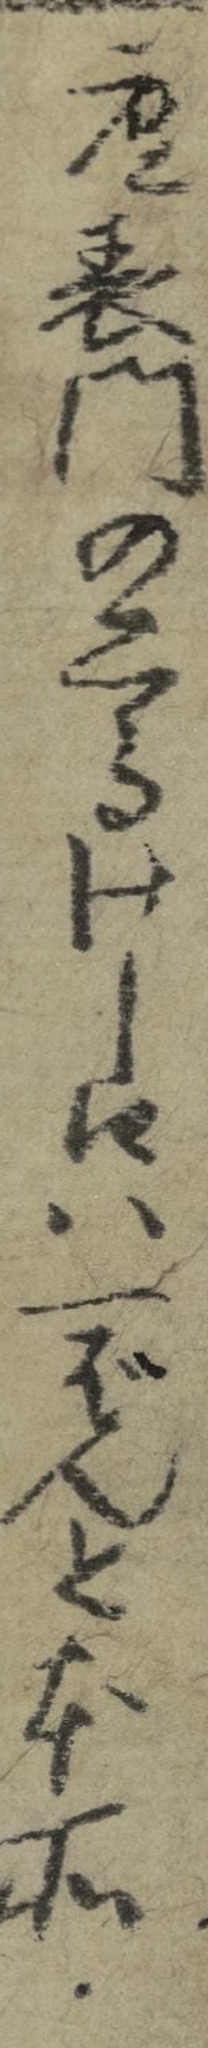座表門のこるけし口ハ一ばんと本所
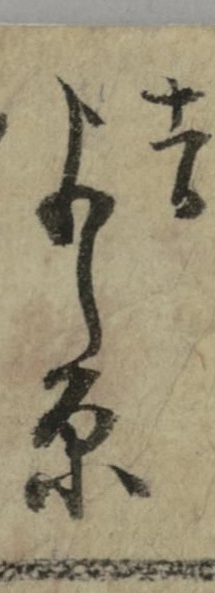十一日
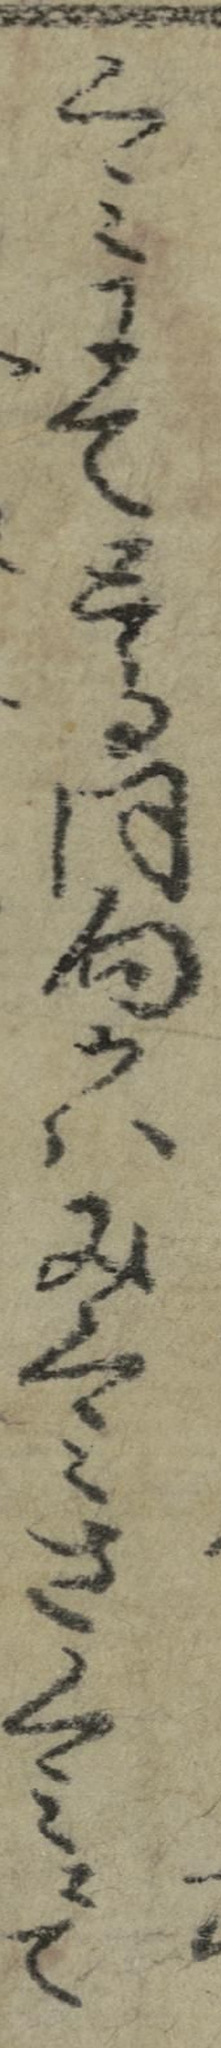くミ二てとる同向かハみくミさくミ二て
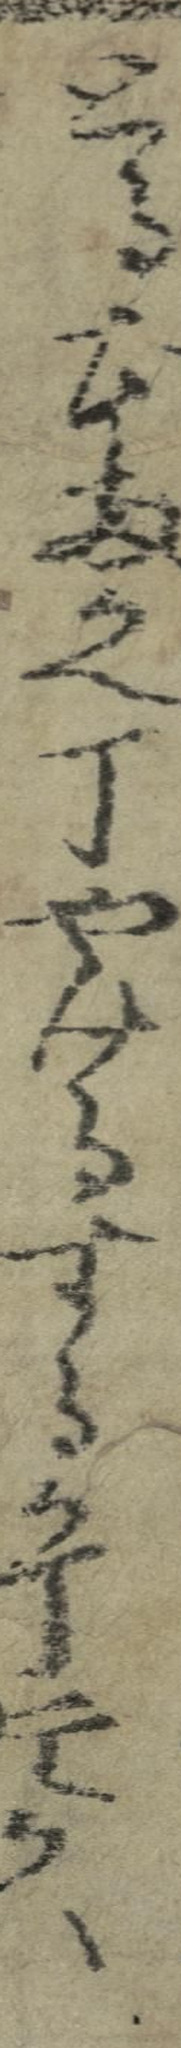とる本兩かへ丁やけるするか丁片かハ
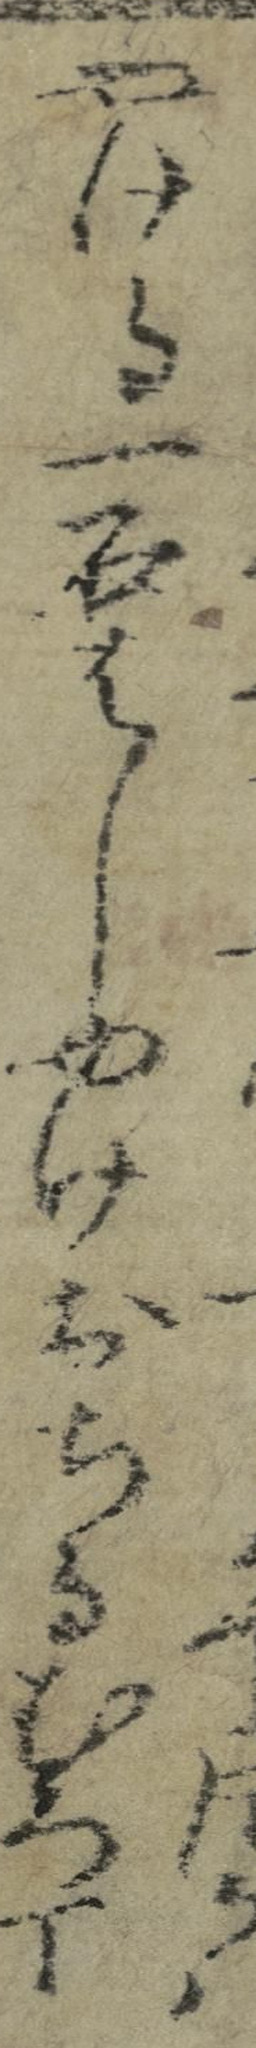やける一石はしやけおちるむろ丁
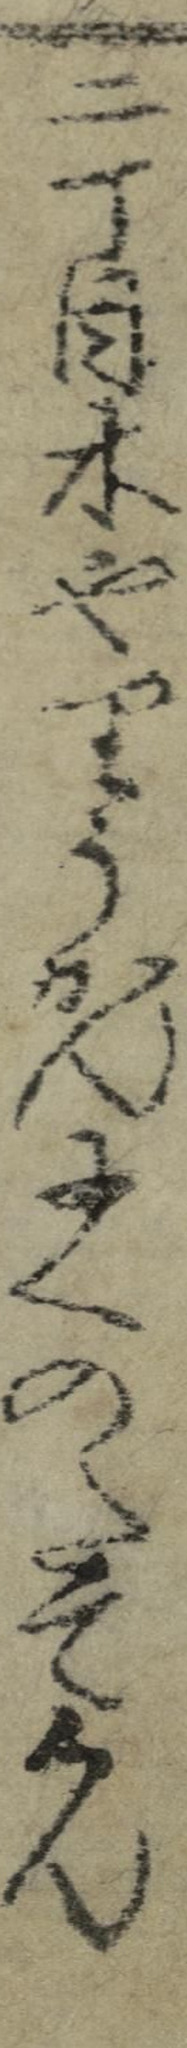二丁目木やりうかんやくのたてかん
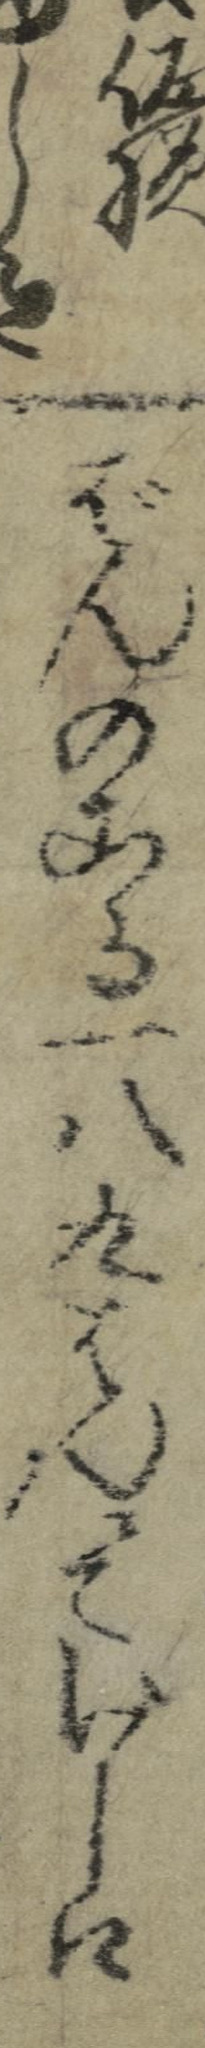ばんのこる一八九はん二てけし口
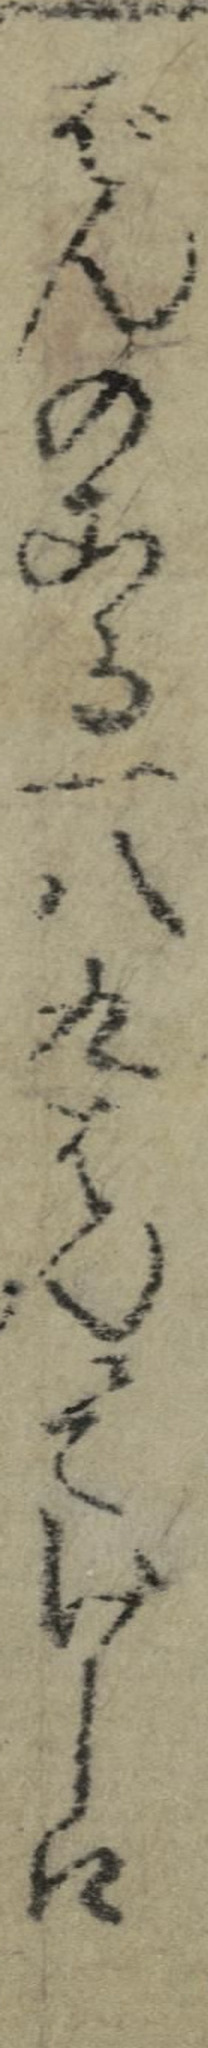ばんのこる一八九はん二てけし口
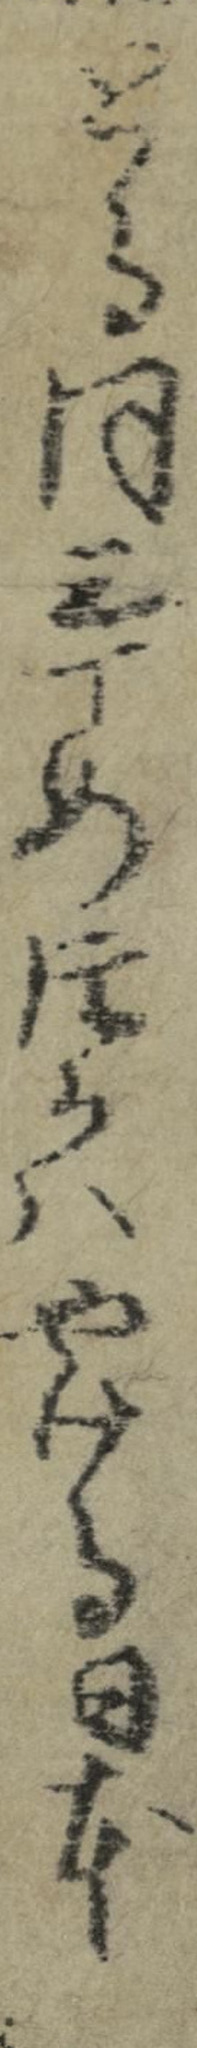とる同三丁め片かハやける日本
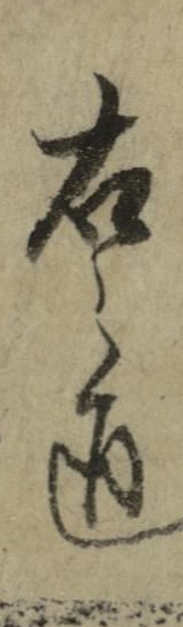右之通
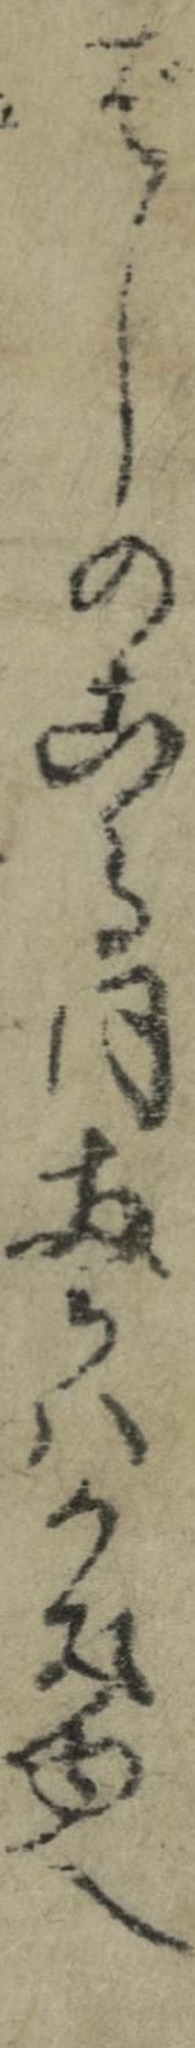ばしのこる同兩かハのみやく
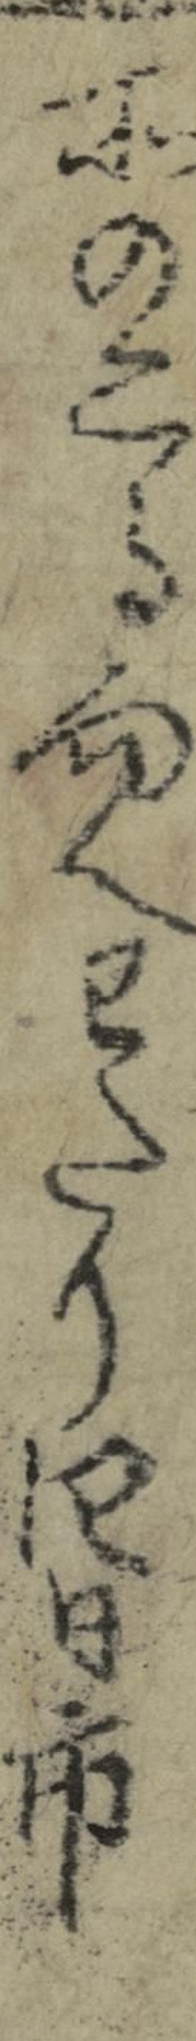所のこる向へわたり四日市
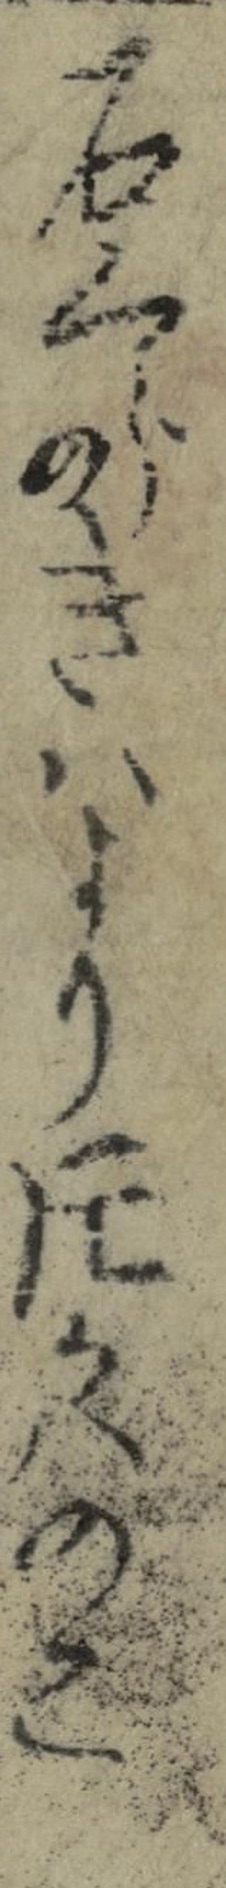石くらのきハより片かハのこ
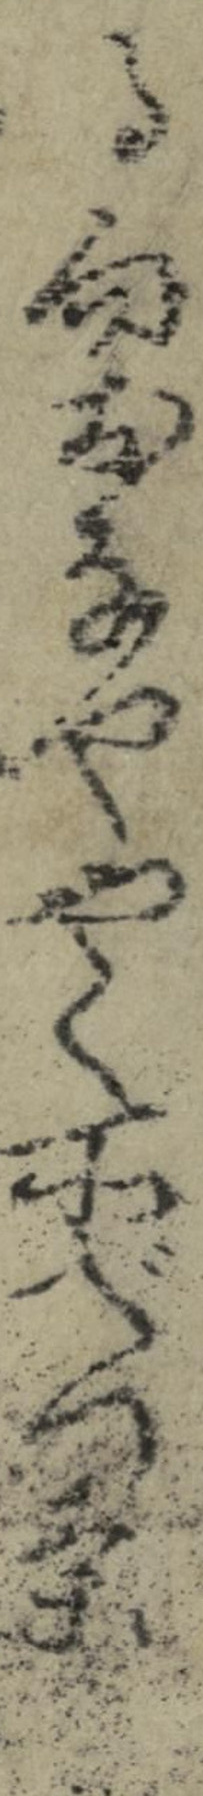る向おなややく所べつ条
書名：[慶応二年十一月の江戸大火に関する瓦版]
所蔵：東京大学地震研究所図書室 Earthquake Research Institute Library, The University of Tokyo, JAPAN
